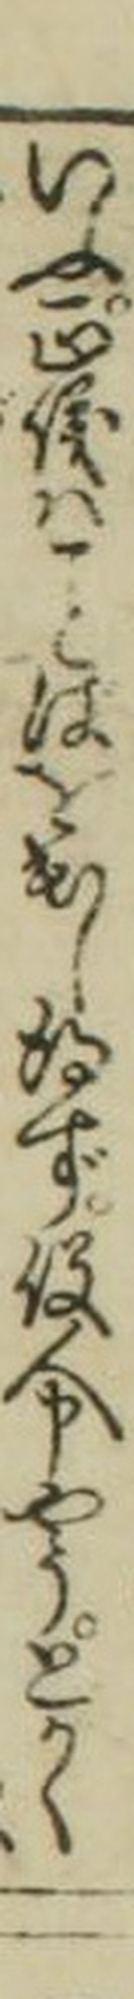いふ。正儀はことばを出し侍ず。役人申やう。とかく
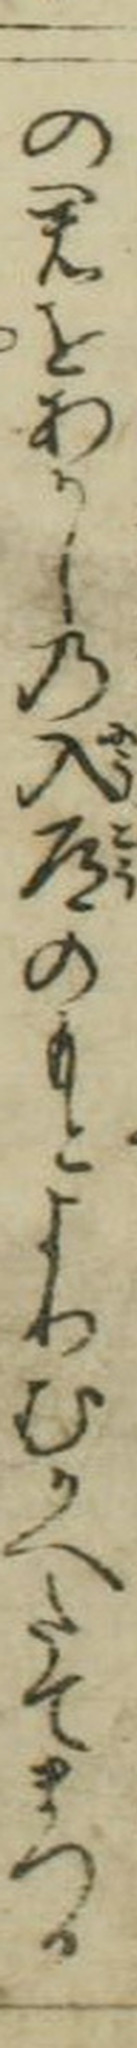の君をあかしの入道のもとよりむかへたてまつる
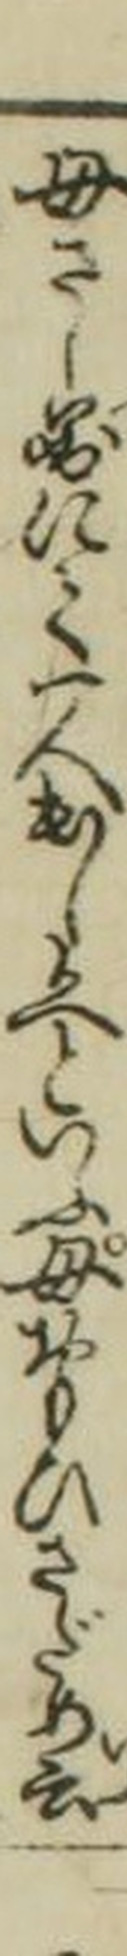母さし図にて一人出し候へといふ。母おもひさだめ云。
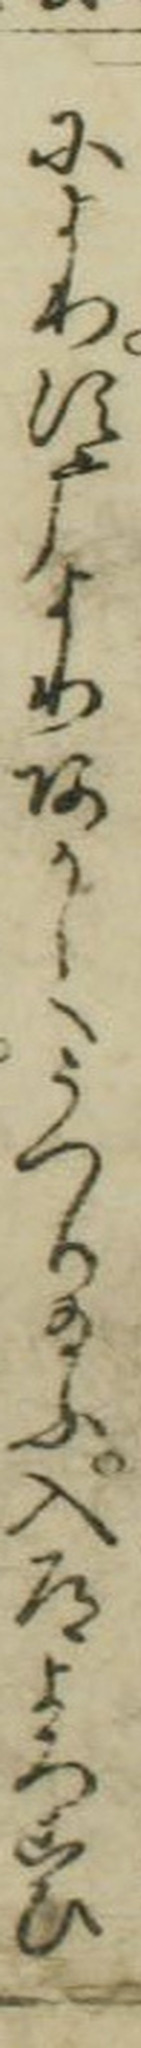により。須磨よりあかしへうつり給ふ。入道よろこひ
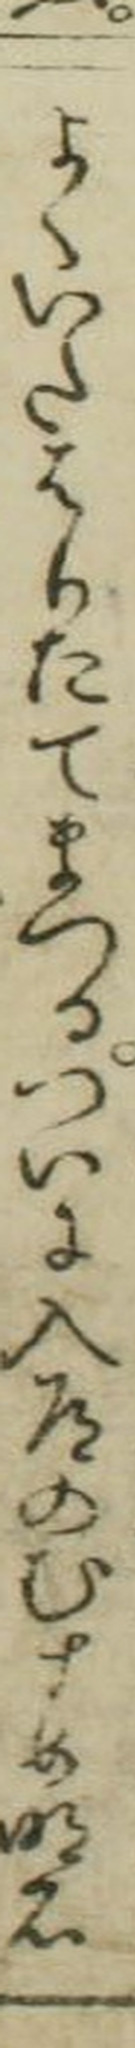よくいたはりたてまつる。ついに入道のむすめ明石
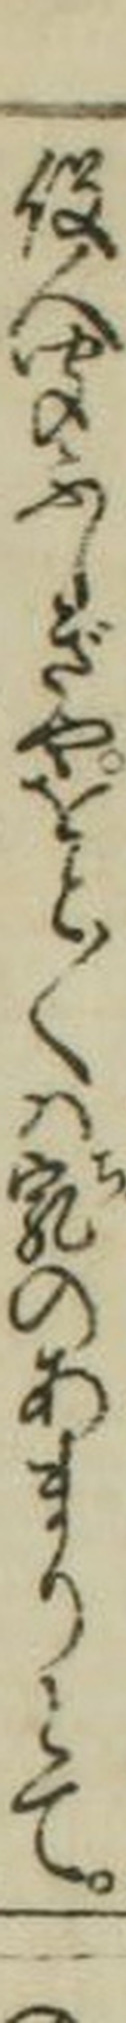役人聞ふしぎや。をと〳〵は乳のあまりとて。
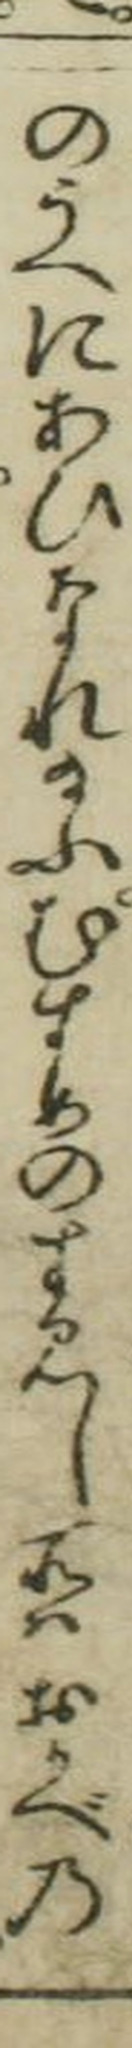のうへにあひなれ給ふ。むすめのすみし所はおかべの
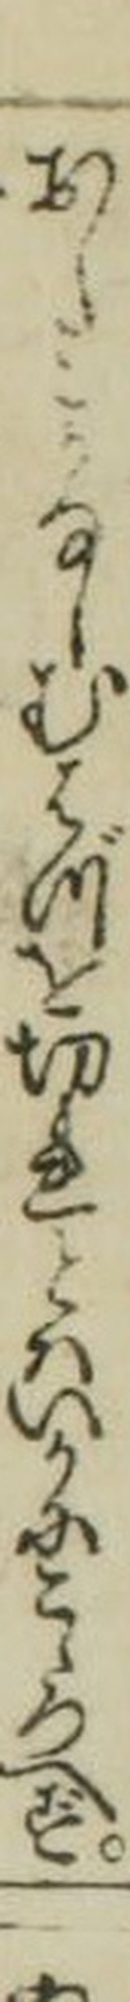おしみかなしむはづを切れとはいかにこゝろへず。
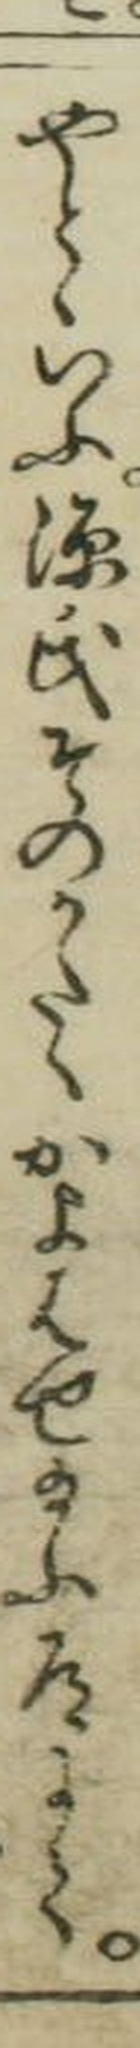やとゝいふ。源氏そのかたへかよはせ給ふ道にて。
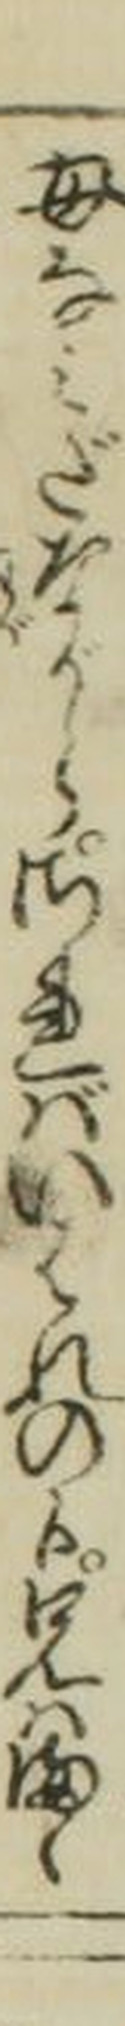母なみだながら。さればいはれの候。兄はまゝ
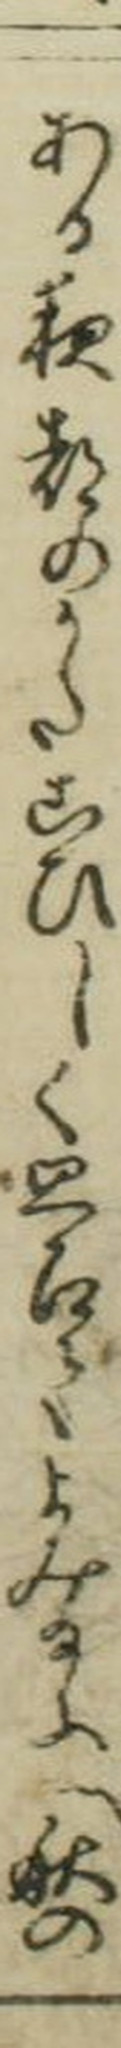ある夜都のかたこひしく思召てよみ給ふ〽秋の
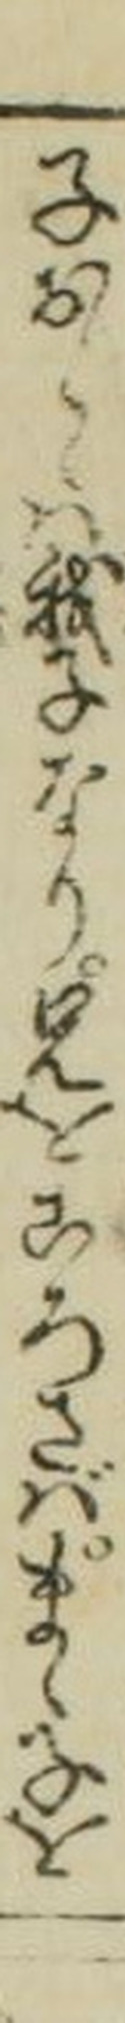子おとゝは我子なり。兄をころさば。まゝ子を
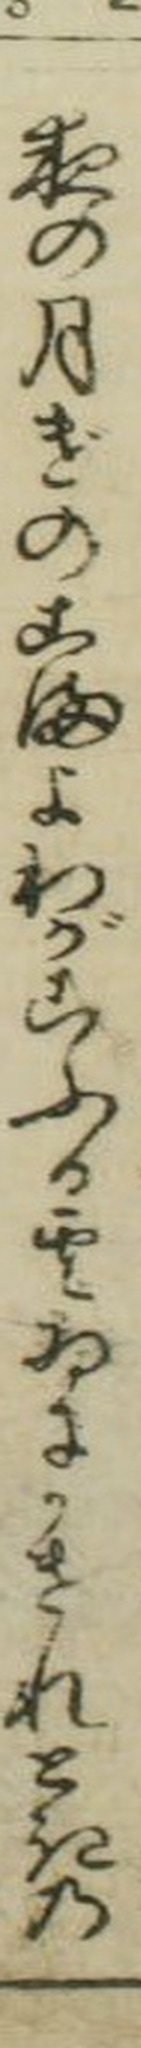夜の月げのこまよわがこふる雲ゐにかけれときの
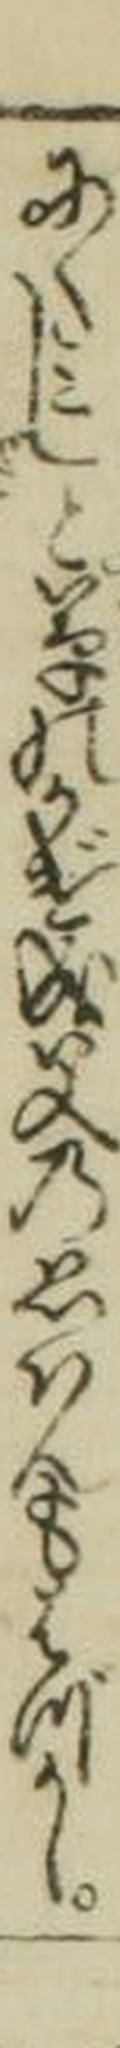にくみしと。草のかげ成父の思はんもはづかし。
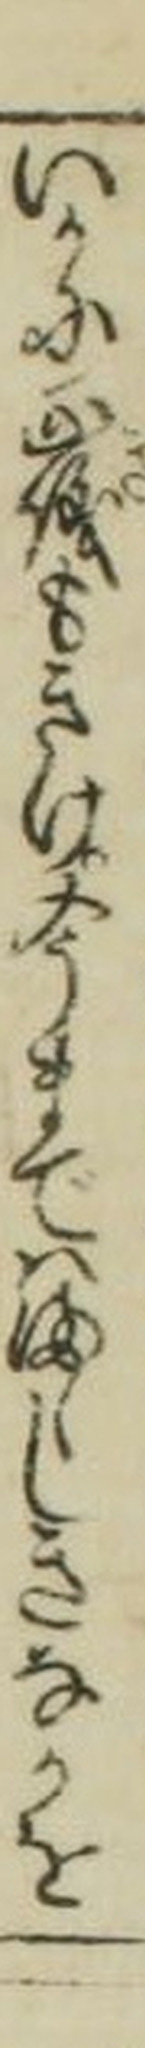いかに正儀もきけ。今まではまゝしきなかを
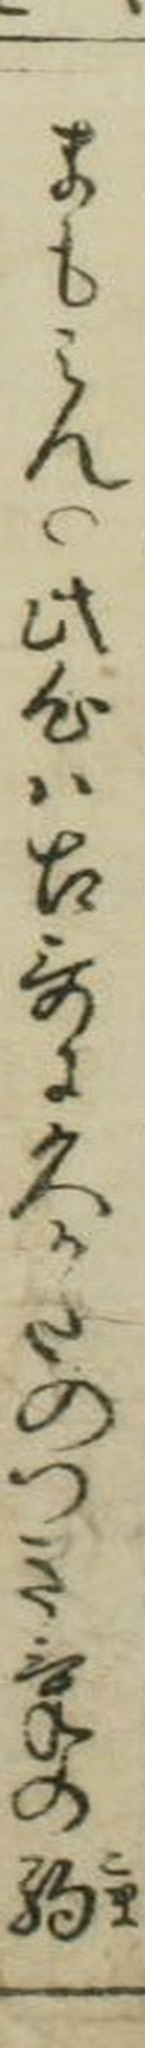まもみん○此心は古哥に久かたのつきけの駒
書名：女源氏教訓鑑
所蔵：東京学芸大学附属図書館
